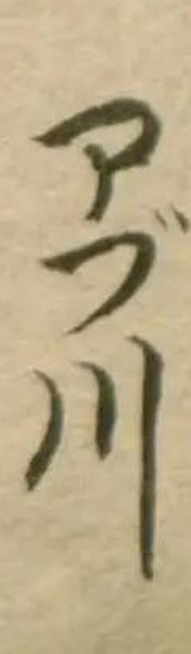アブ川
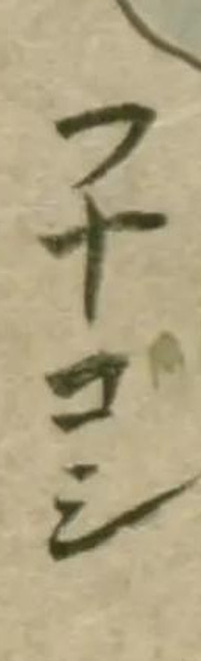フナゴシ
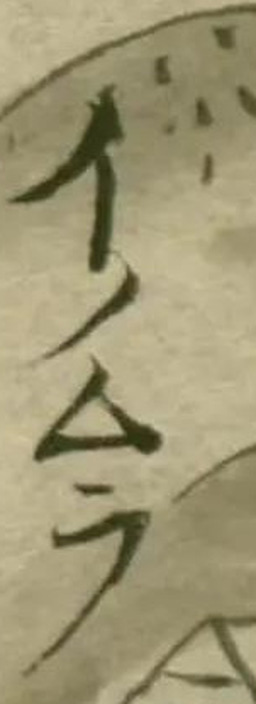イノムラ
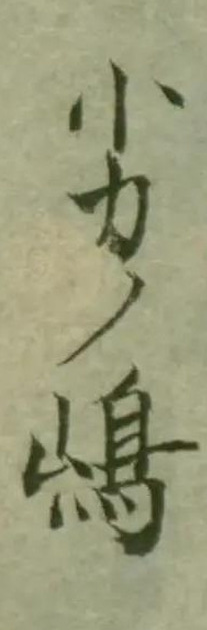小カノ嶋
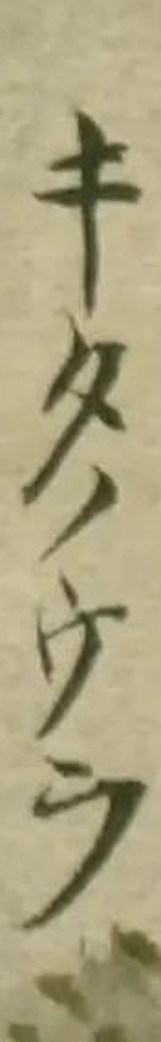キタノウラ
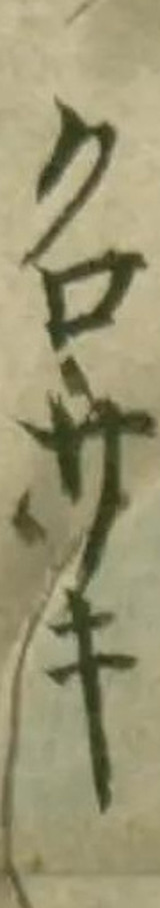クロサキ
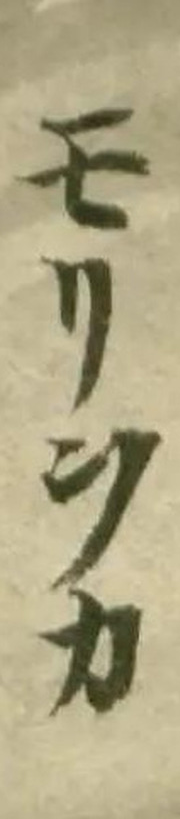モリヲカ
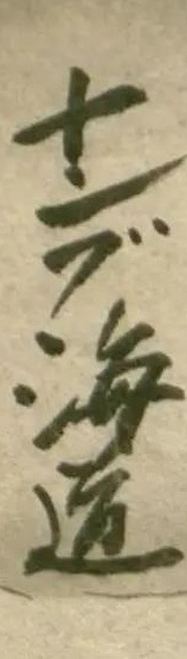ナンブ海道

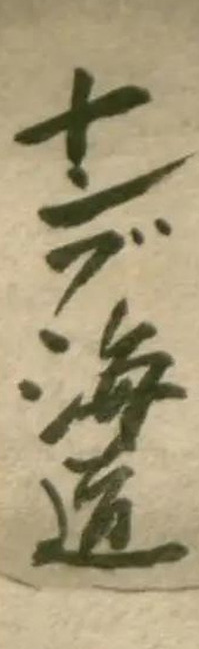ナンブ海道
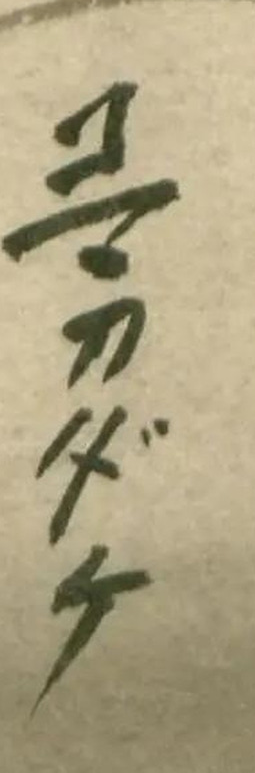コマカダケ
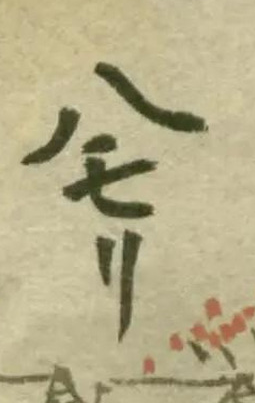八モリ
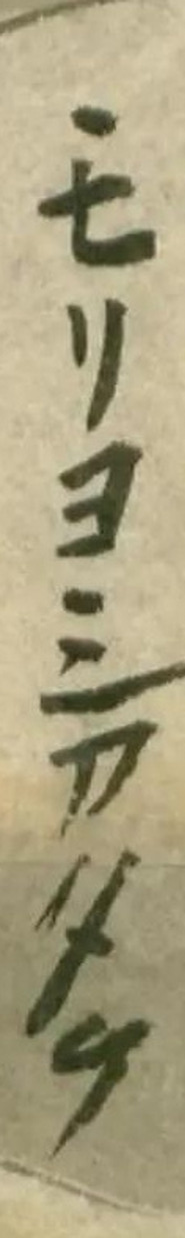モリヨシカタケ
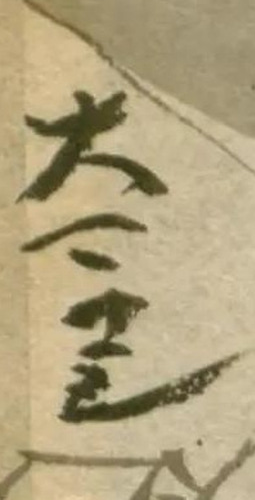大マコシ

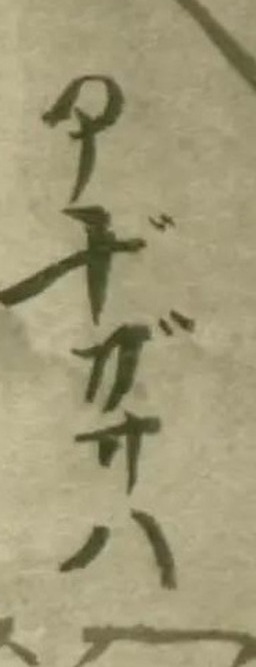アヂガサハ
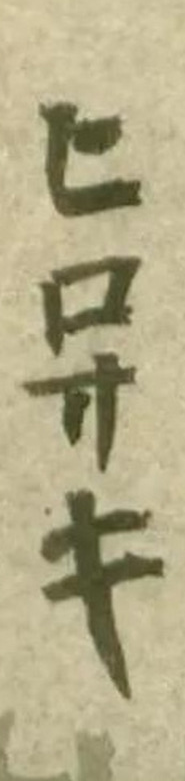ヒロサキ
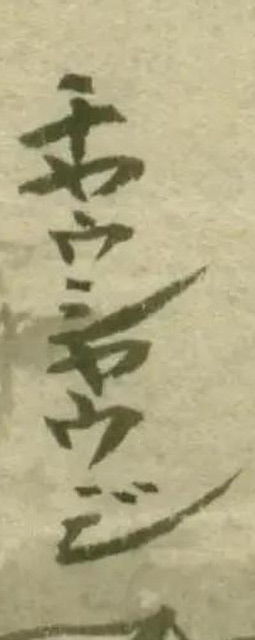チヤウシヤウジ
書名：江戸より奥州津輕迄道筋之圖
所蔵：国立国会図書館 National Diet Library, JAPAN
